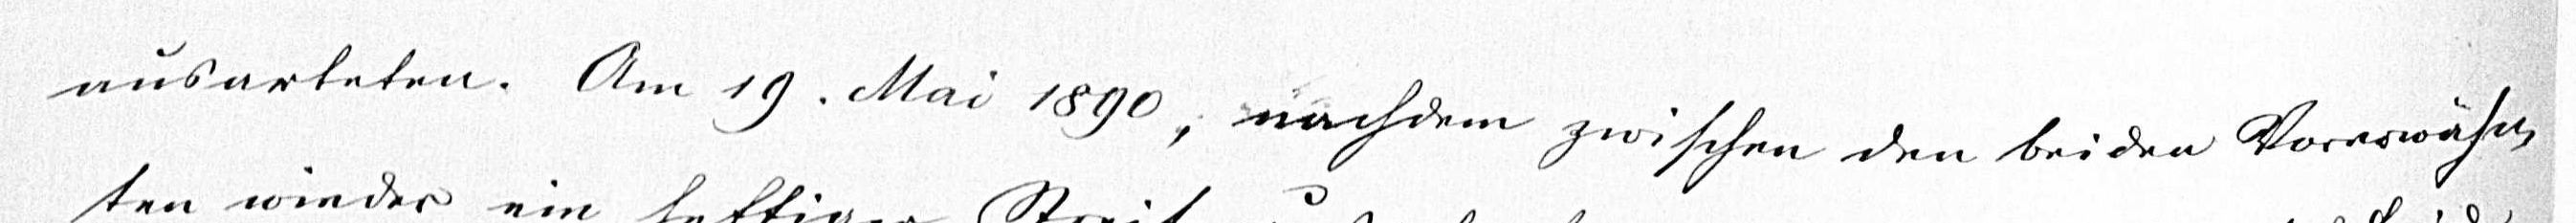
ausarteten. Am 19. Mai 1890, nachdem zwischen den beiden Vorerwähn¬
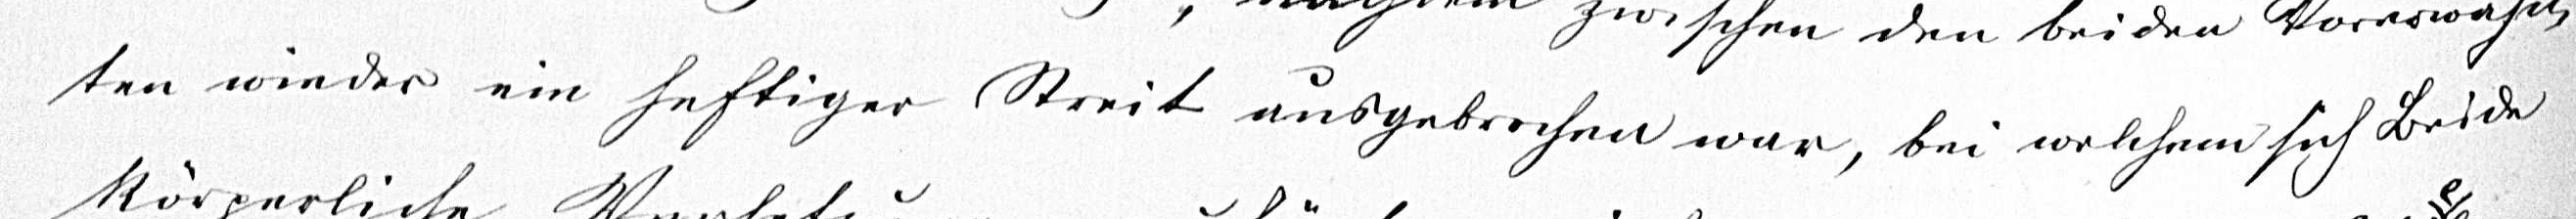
ten wieder ein heftiger Streit ausgebrochen war, bei welchem sich Beide
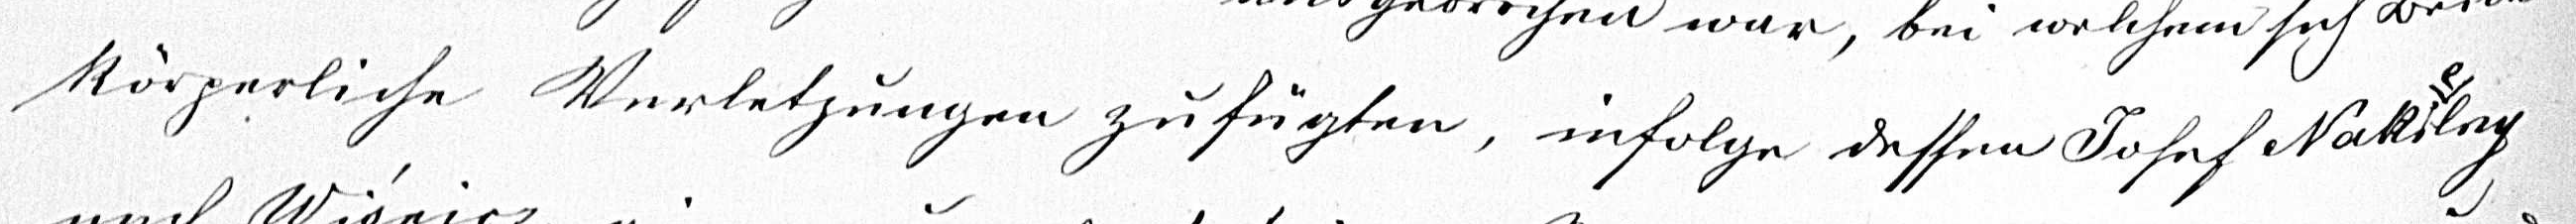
körperliche Verletzungen zufügten, infolge dessen Josef Nakxx
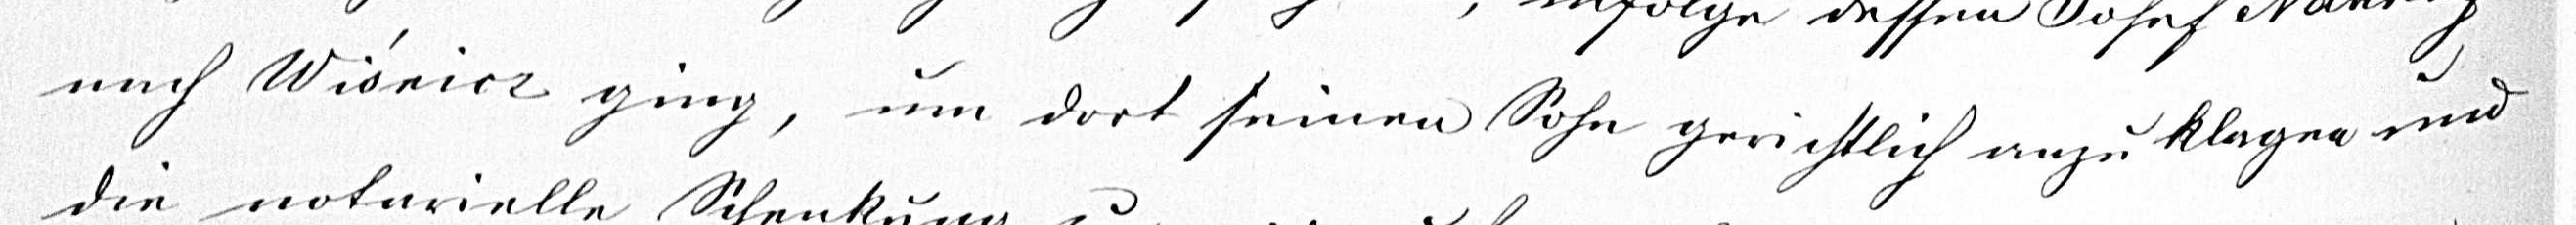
nach Wiśnicz ging, um dort seinen Sohn gerichtlich anzuklagen und
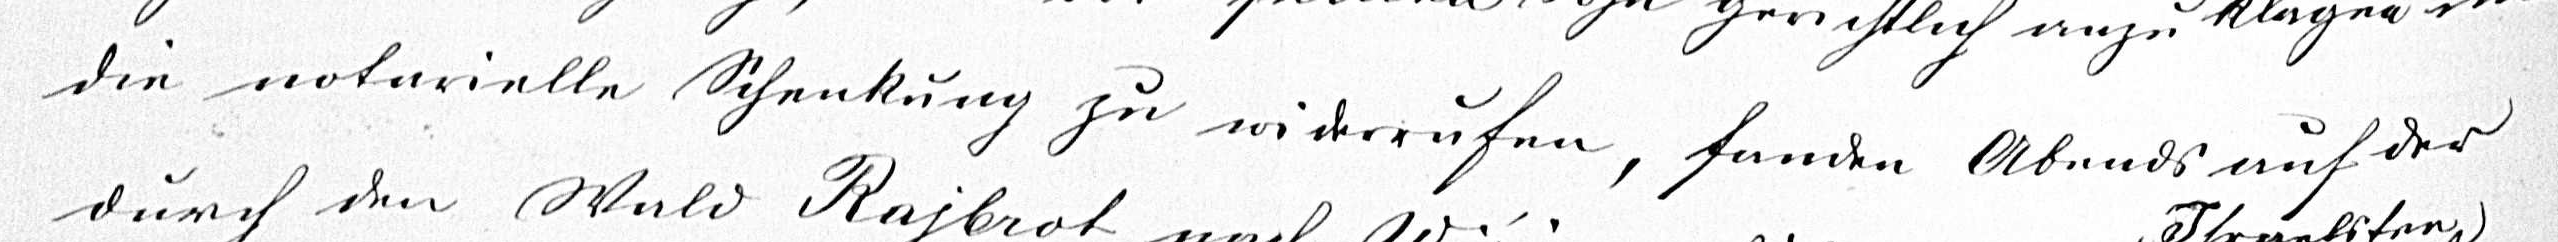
die notarielle Schenkung zu widerrufen, fanden Abends auf der
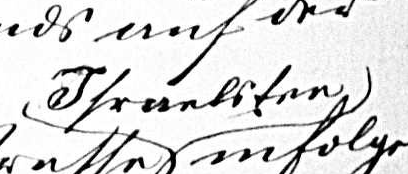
Israelsten
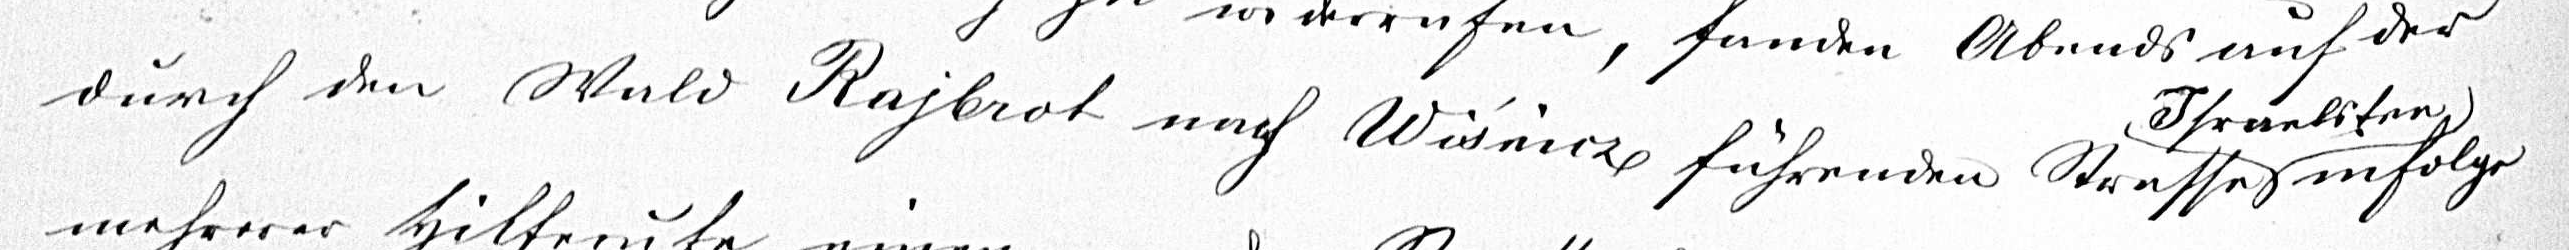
durch den Wald Rajbrot nach Wiśnicz führenden Strasse infolge
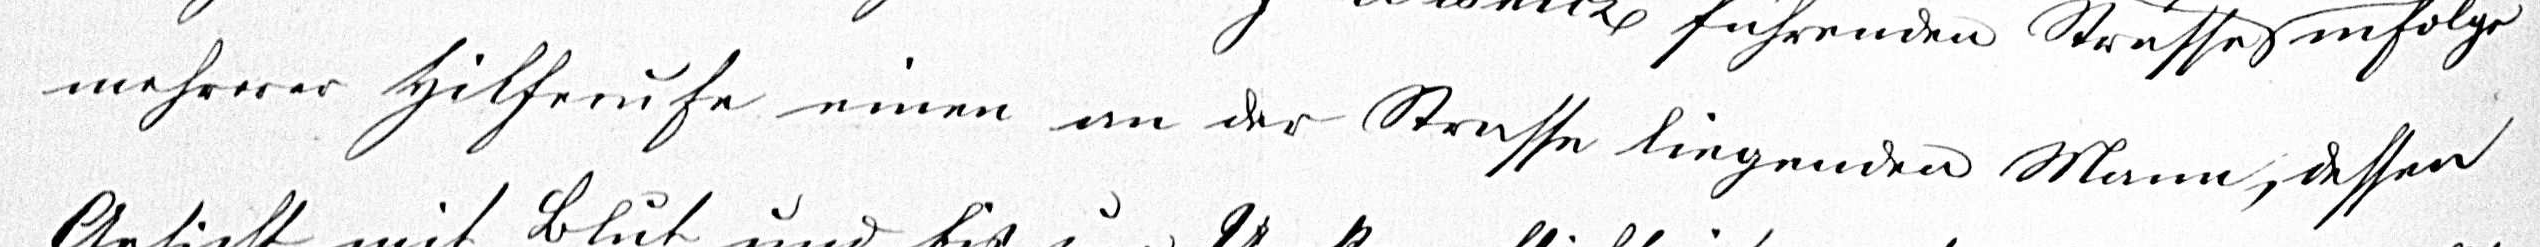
mehrerer Hilferufe einen an der Strasse liegenden Mann, dessen
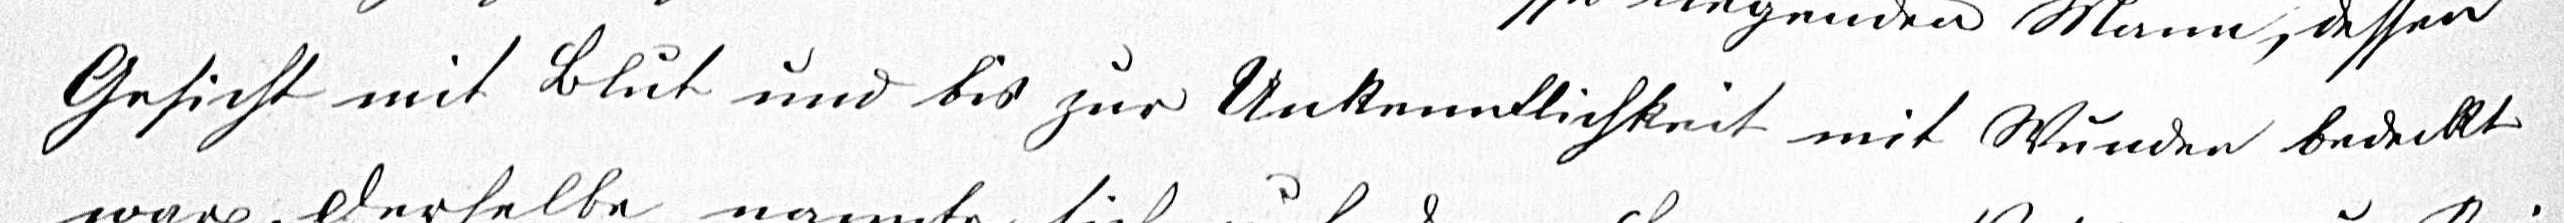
Gesicht mit Blut und bis zur Unkenntlichkeit mit Wunden bedeckt
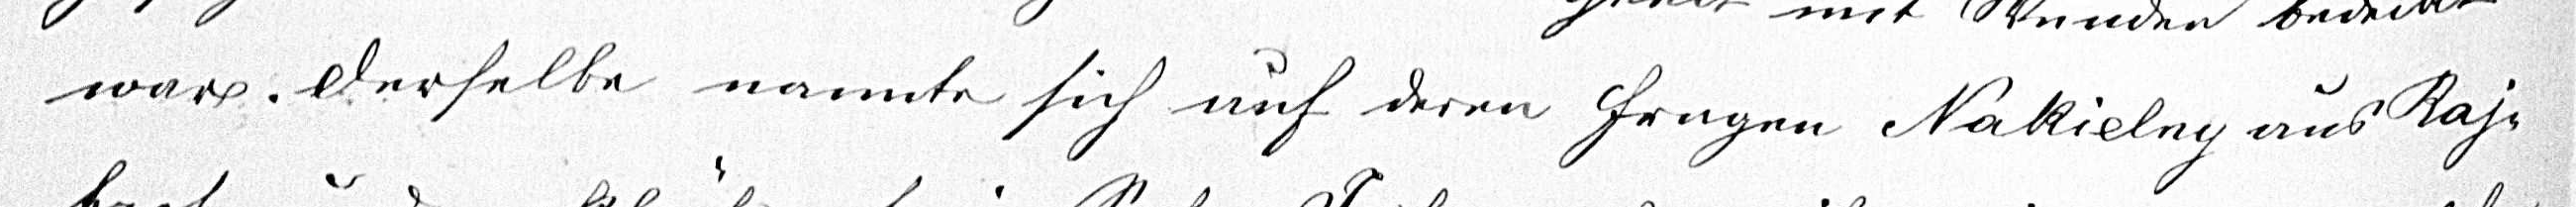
war. Derselbe nannte sich auf deren Fragen Nakielny aus Raj¬
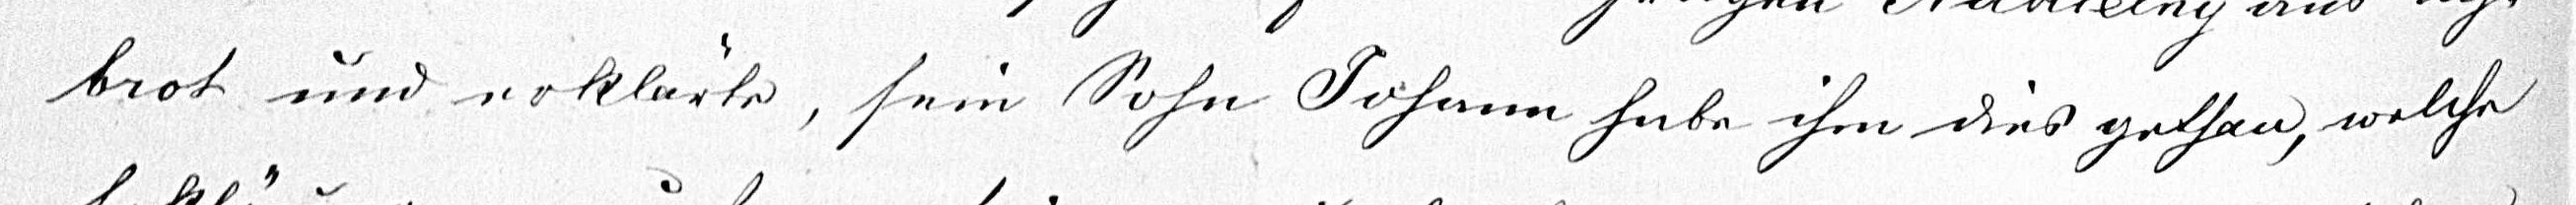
brot und erklärte, sein Sohn Johann habe ihm dies gethan, welche
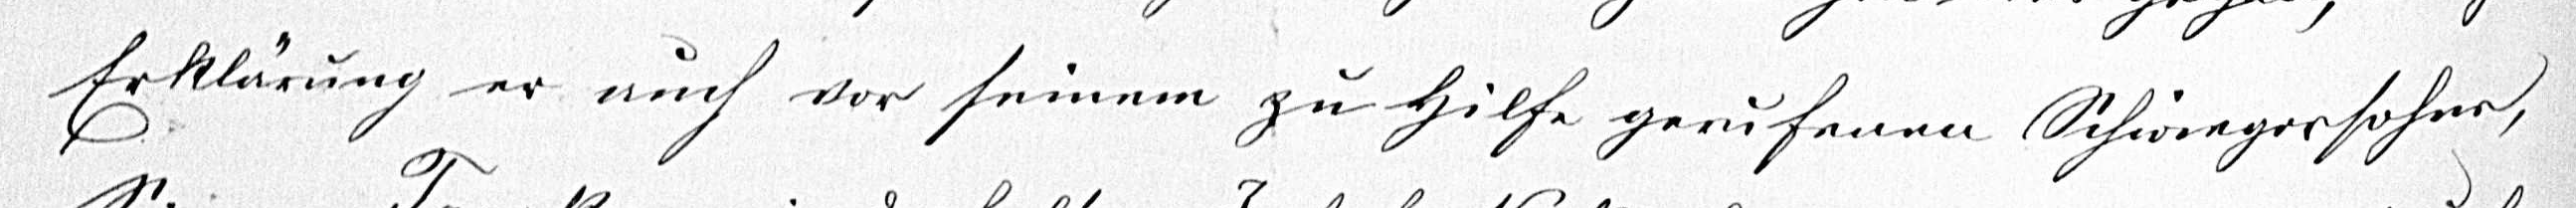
Erklärung er auch vor seinem zu Hilfe gerufenen Schwiegerxxhen,
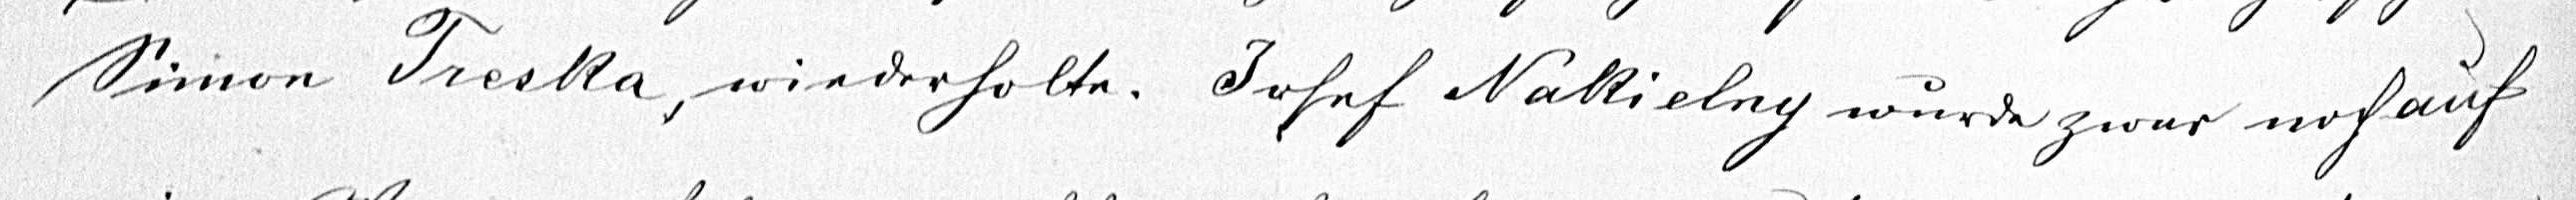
Simon Treska, wiederholte. Josef Nakielny wurde zwar noch auf
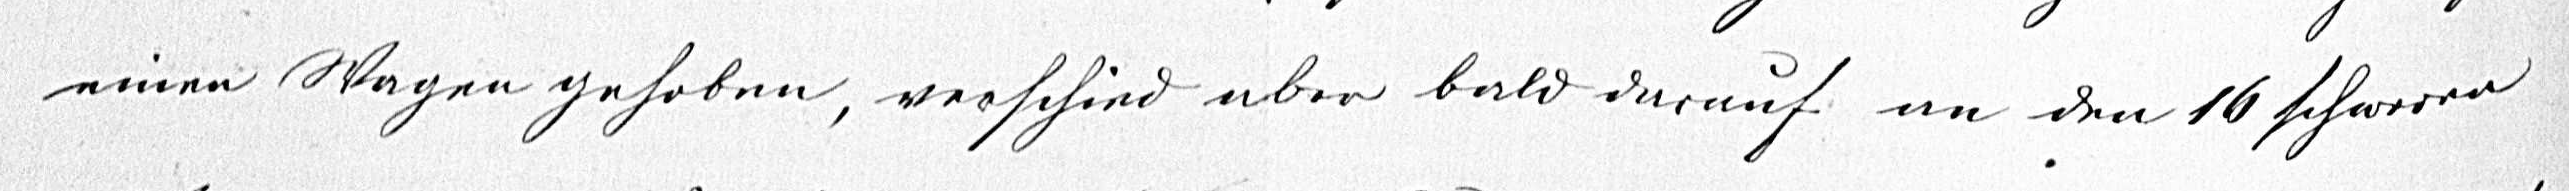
einen Wagen gehoben, verschied aber bald darauf an den 16 schweren
